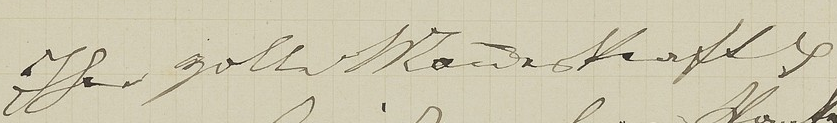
Ihre volle Manneskraft &
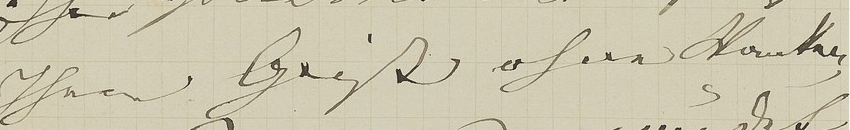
Ihren Geist ohne Wanken,
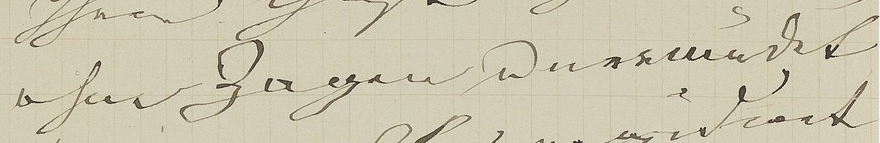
ohne Zagen, unermüdet
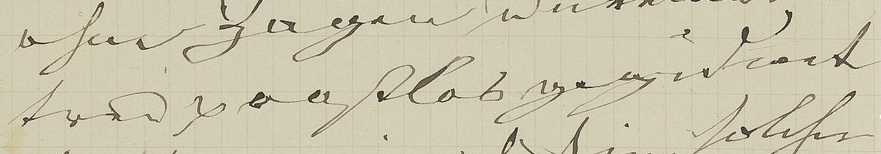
treu & rastlos gewidmet
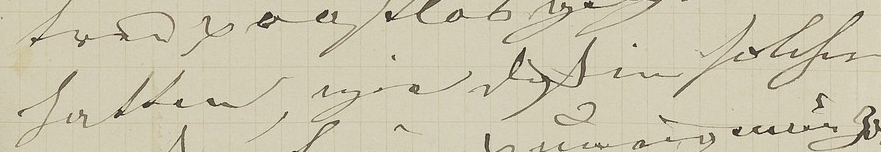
hatten, wie dieß in solcher
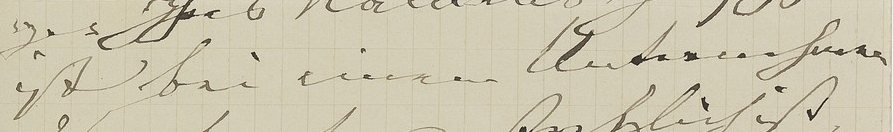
ist, bei einem Unternehmen,
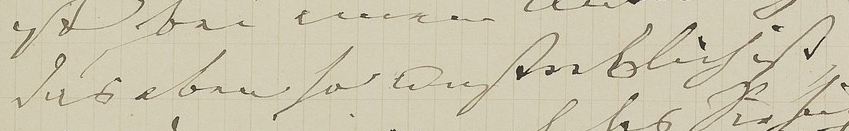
das eben so anstreblich ist,
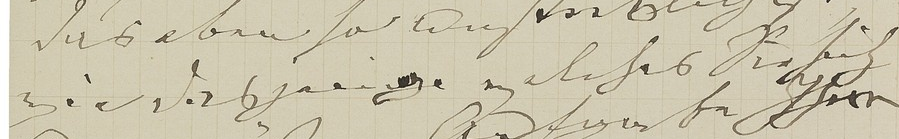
wie dasjenige welches Sie sich
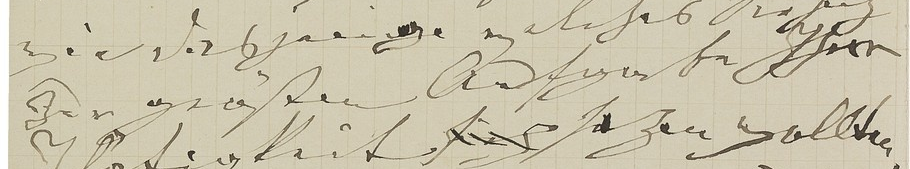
zur größten Aufgabe Ihrer
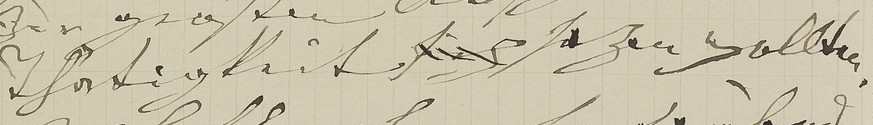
Thätigkeit sezen wollten.
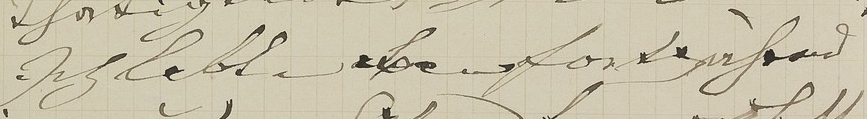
Ich lebte eben fortwährend
